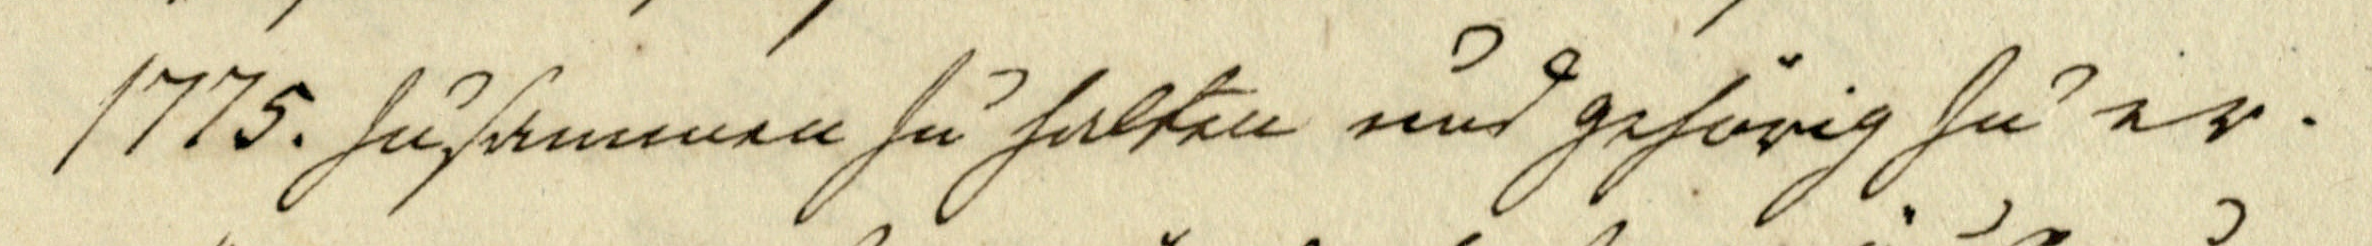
1775. zusammen zu halten und gehörig zu er¬
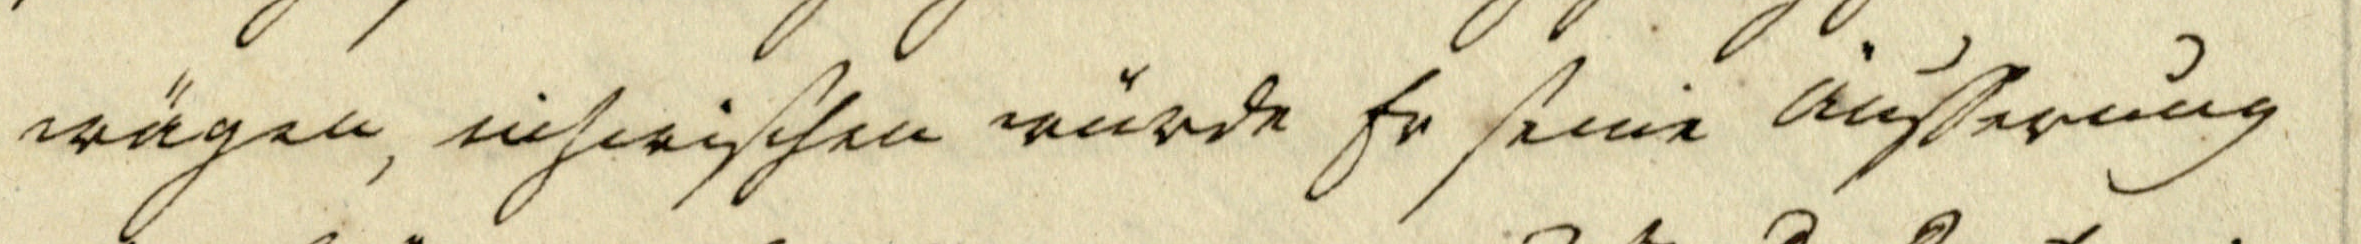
wägen, inzwischen würde Er seine Äusserung
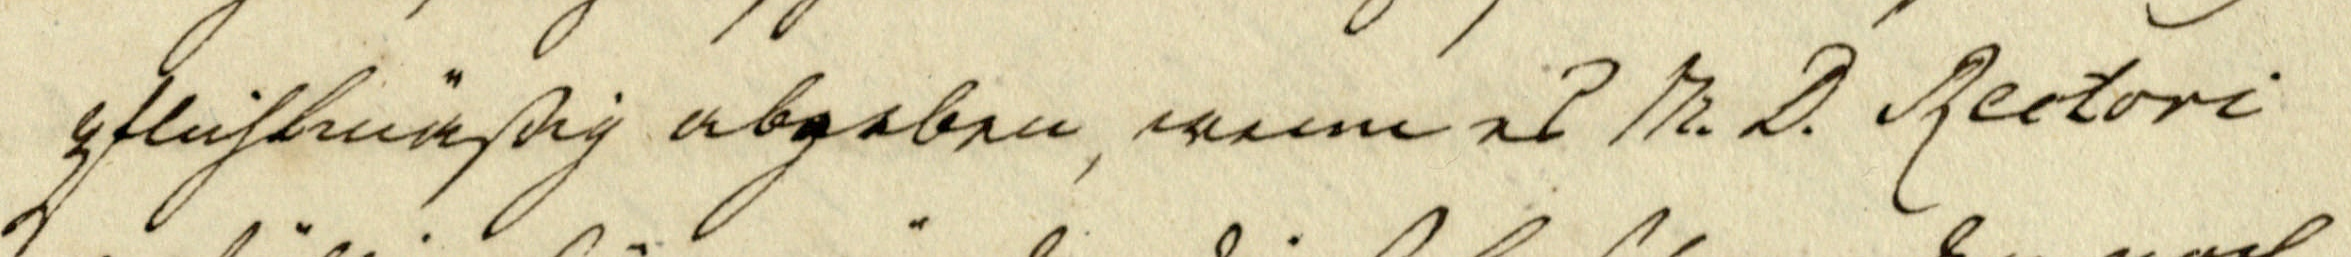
pflichtmäßig abgeben, wenn es M. D. Rectori
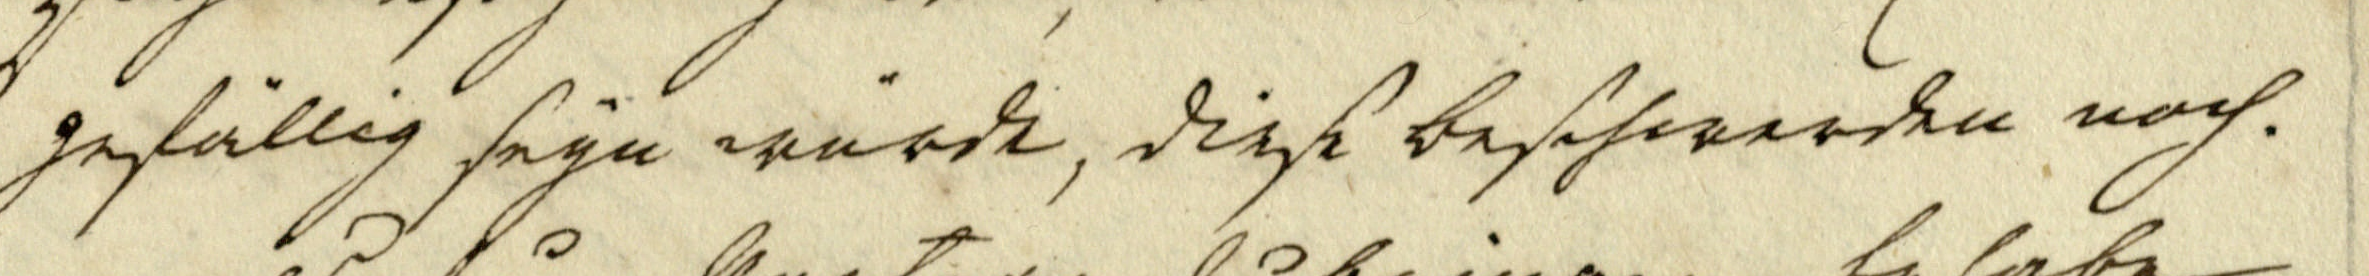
gefällig seÿn würde, diese Beschwerden noch¬
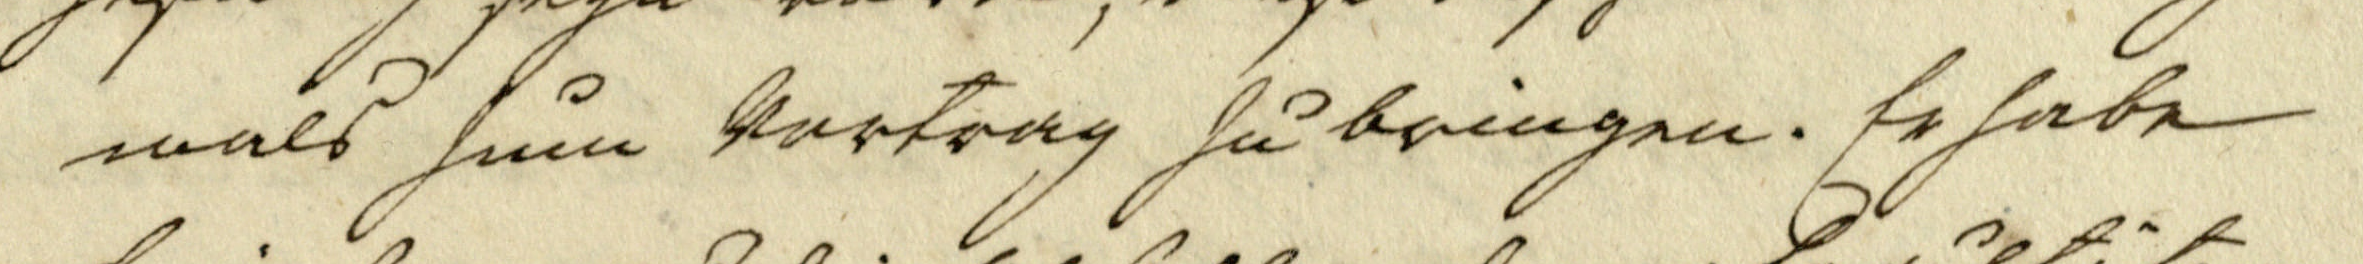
mals zum Vortrag zu bringen. Er habe
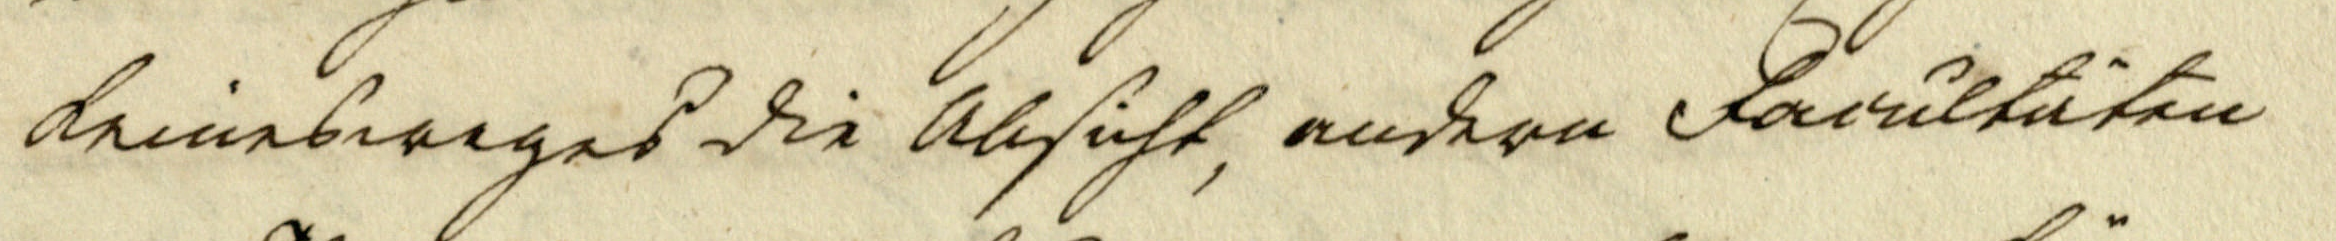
keinesweges die Absicht, andern Facultäten
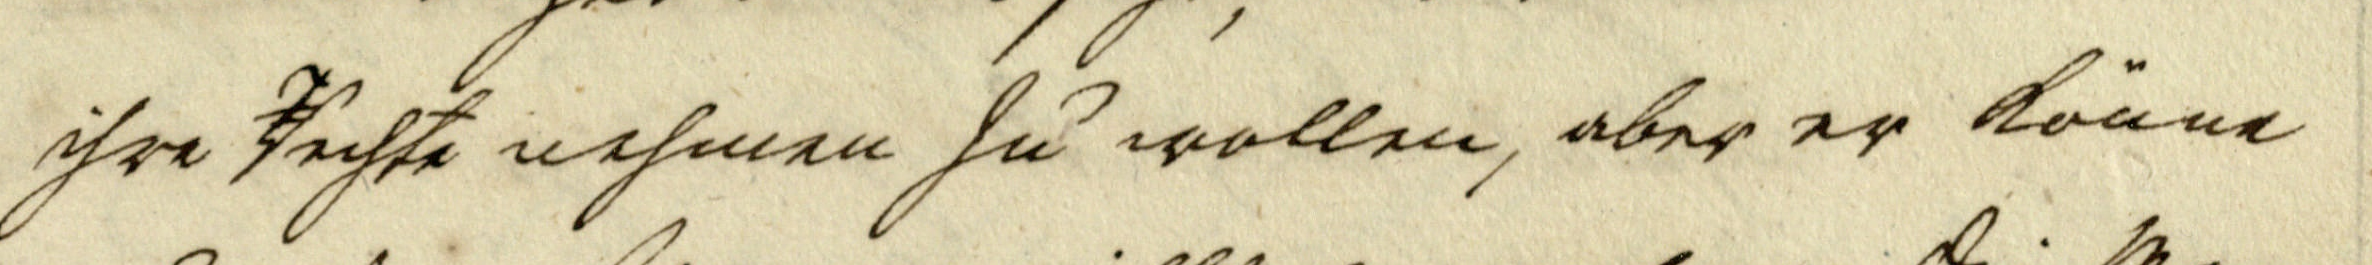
ihre Rechte nehmen zu wollen, aber er könne
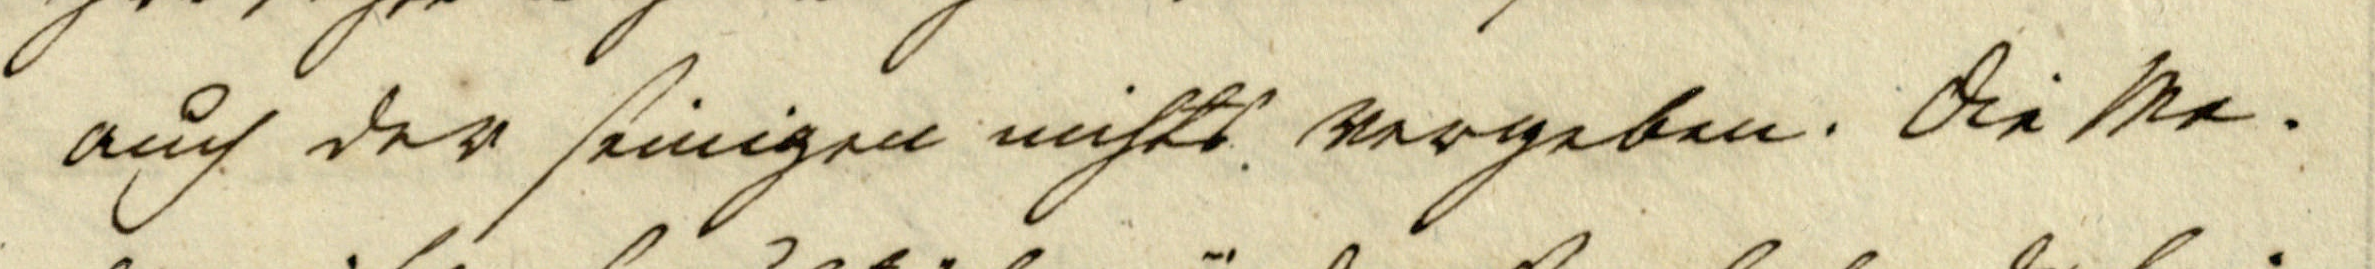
auch der seinigen nichts vergeben. Die Me¬
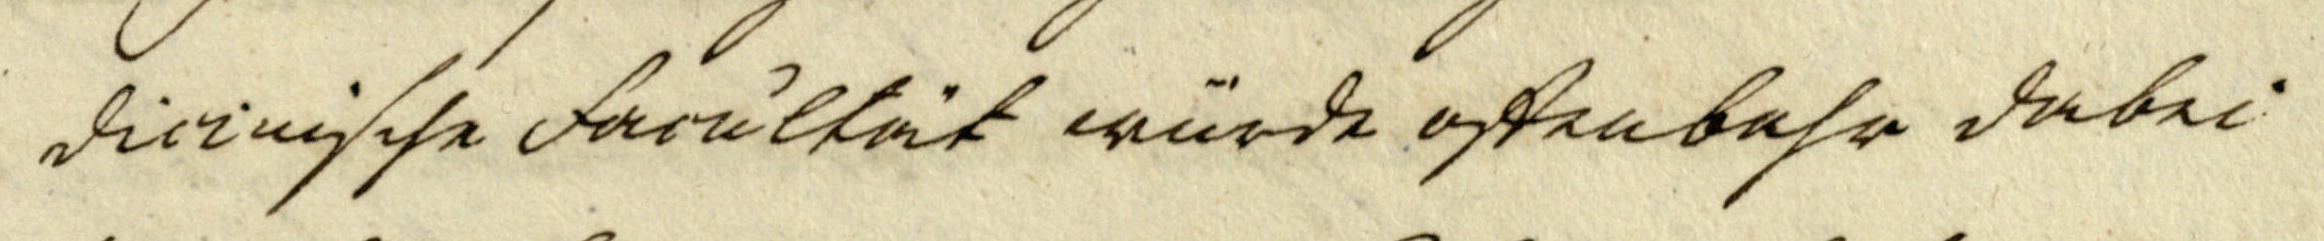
dicinische Facultät würde offenbahr dabei
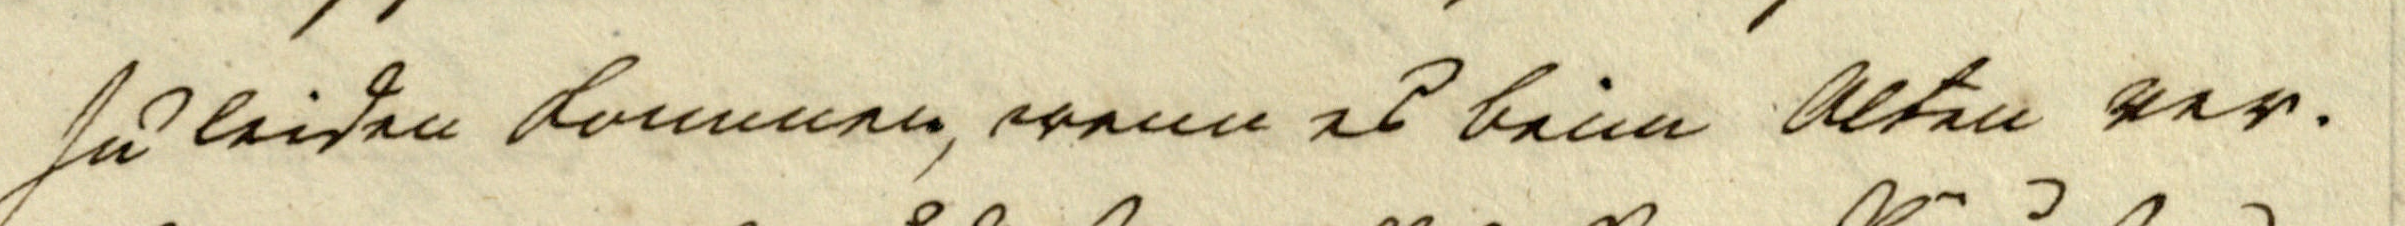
zu leiden kommen, wenn es beim Alten ver¬
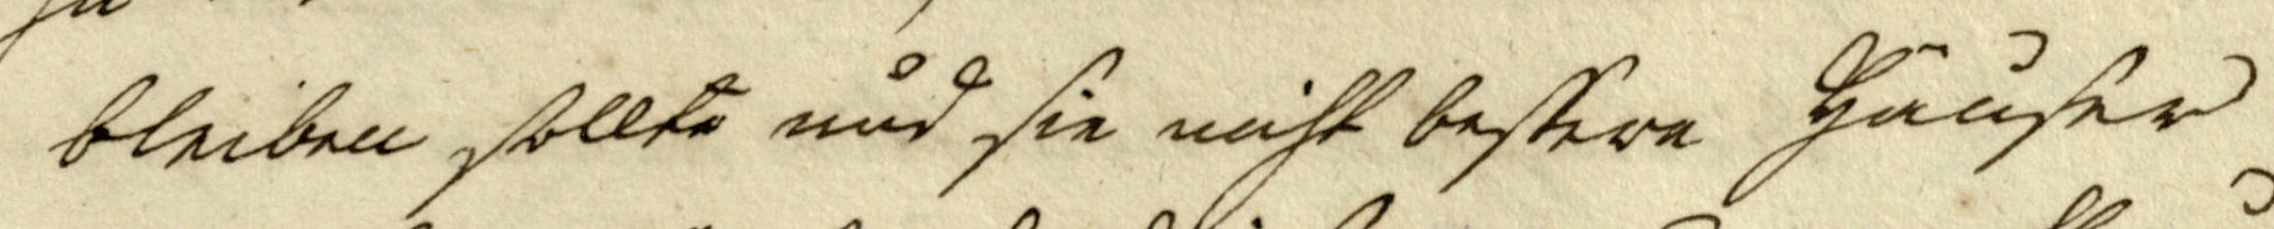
bleiben sollte und sie nicht bessere Häuser
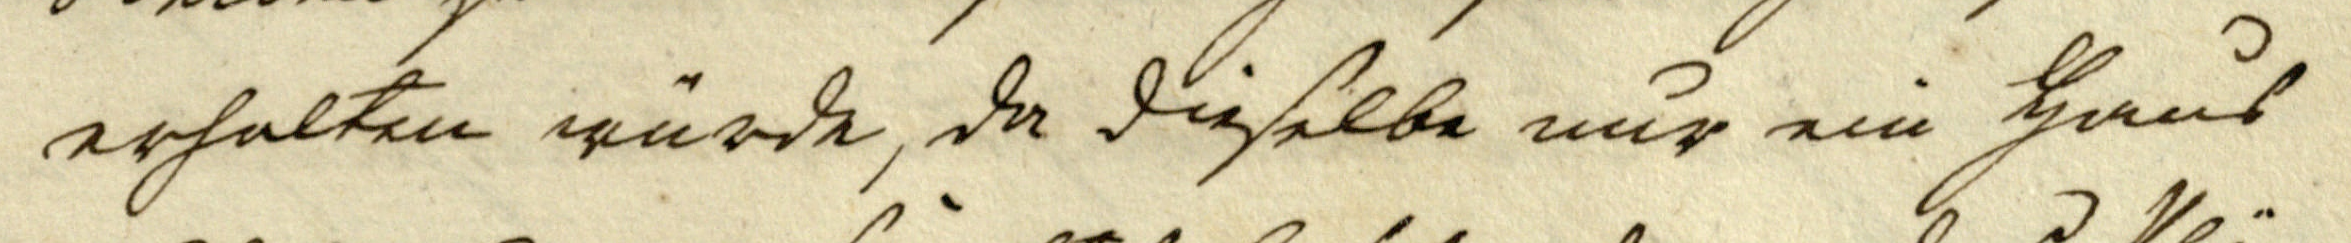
erhalten würde, da dieselbe nur ein Haus
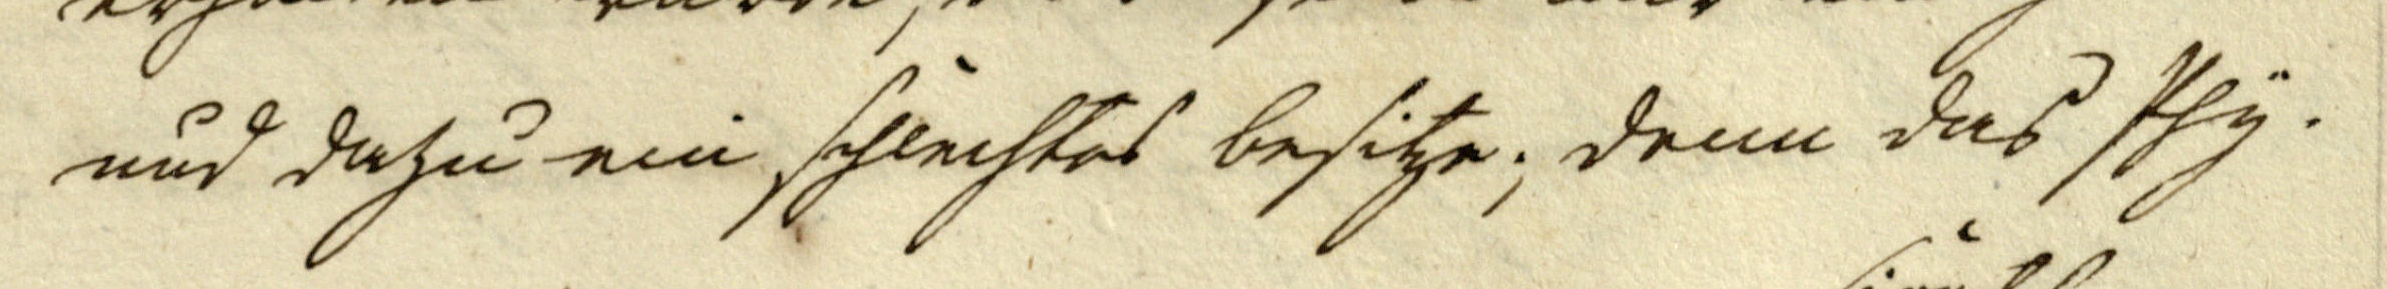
und dazu ein schlechtes besitze; denn das Phÿ¬
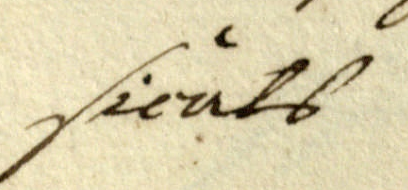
sicats
